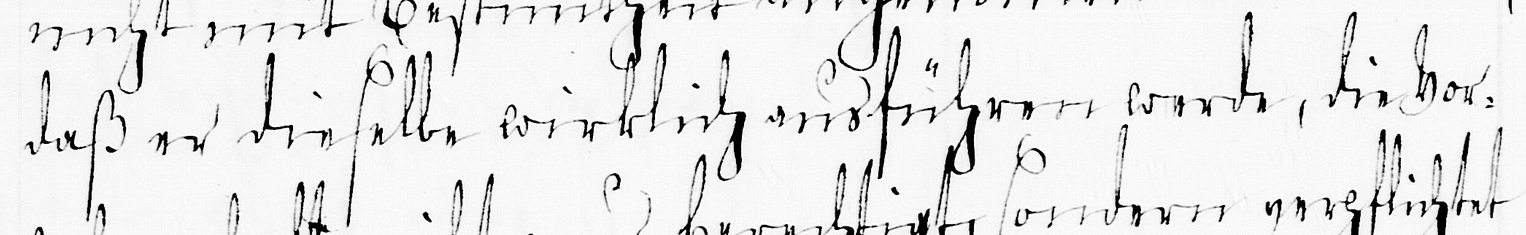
daß er dieselbe wirklich ausführen werde, die Vor¬
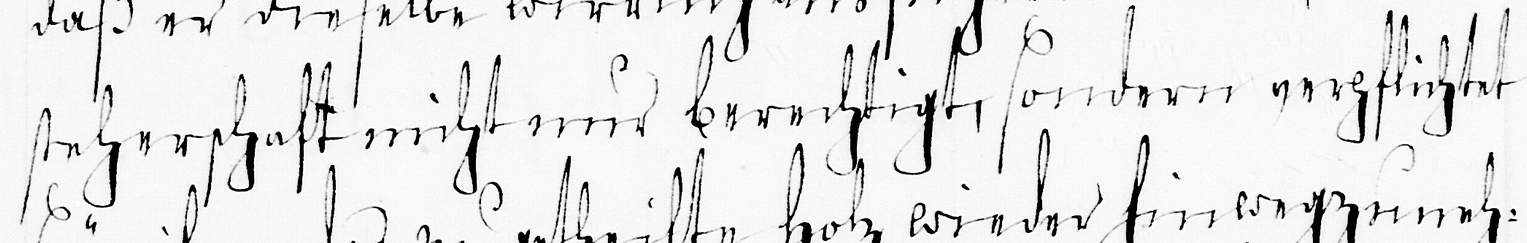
steherschaft nicht nur berechtigt, sondern verpflichtet
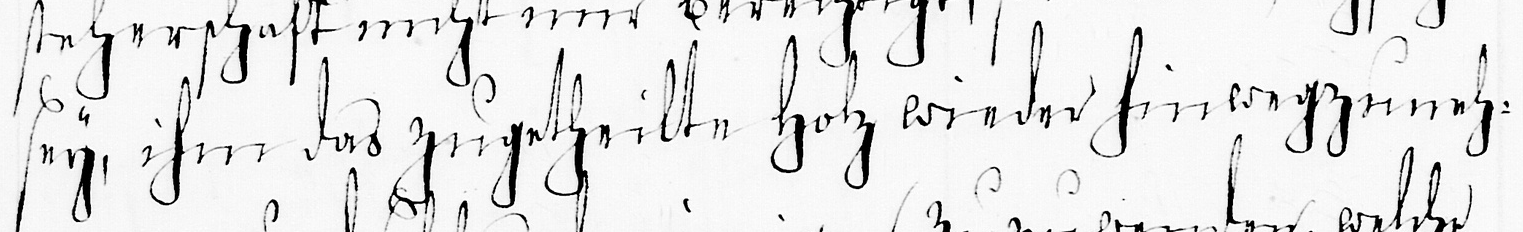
sey, ihm das zugetheilte Holz wieder hinwegzuneh¬
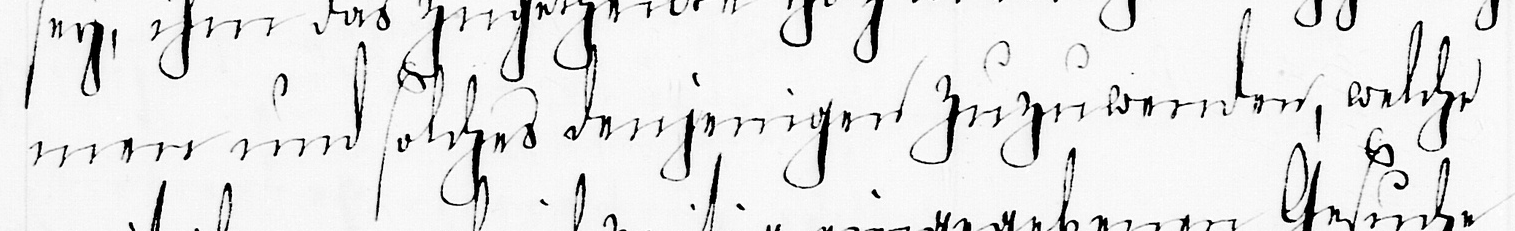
men und solches denjenigen zuzuwenden, welche
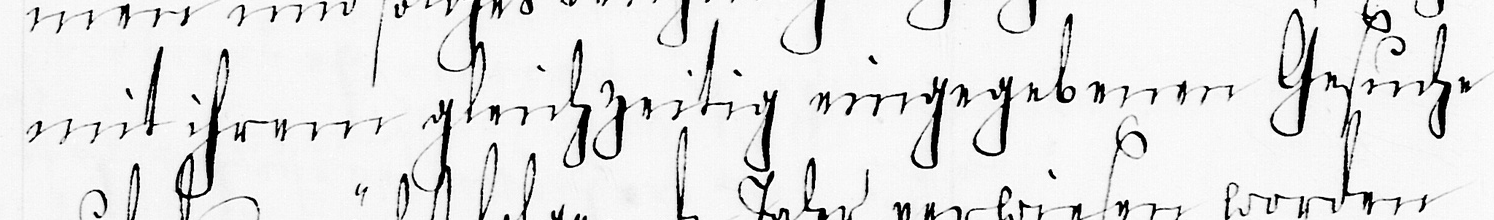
mit ihrem gleichzeitig eingegebenen Gesuche
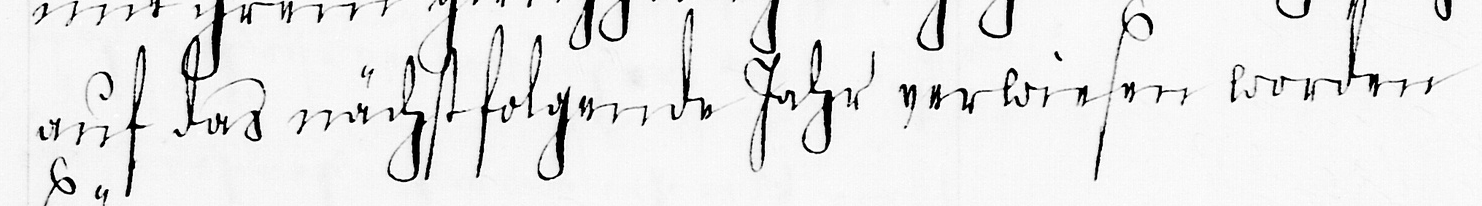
auf das nächstfolgende Jahr verwiesen worden
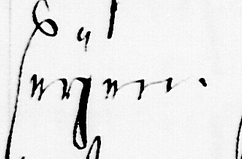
seyen.
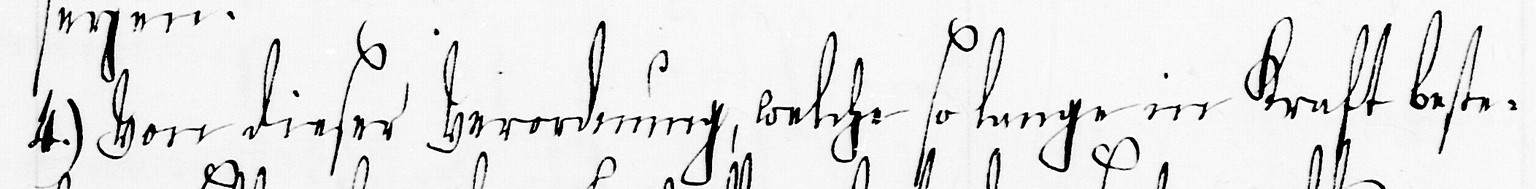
4.) Von dieser Verordnung, welche so lange in Kraft best¬
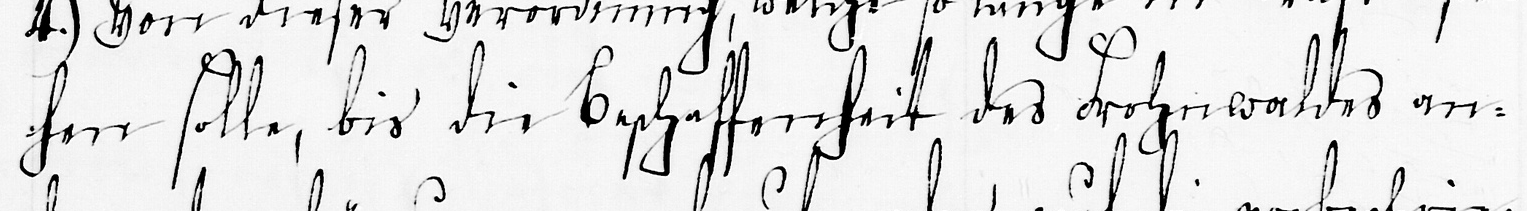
ehen solle, bis die Beschaffenheit des Frohnwaldes an¬
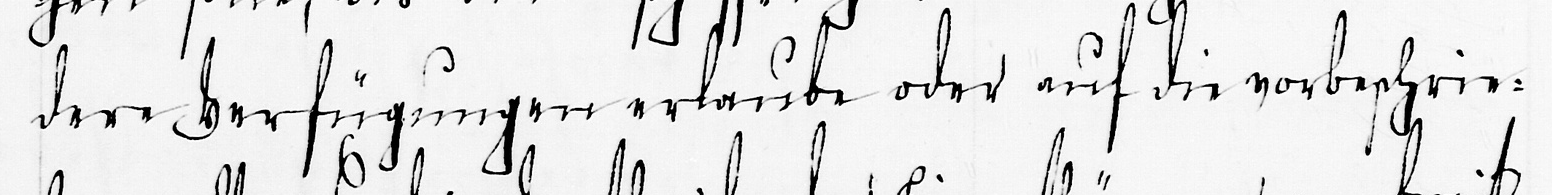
dere Verfügungen erlaube oder auf die vorbeschrie¬
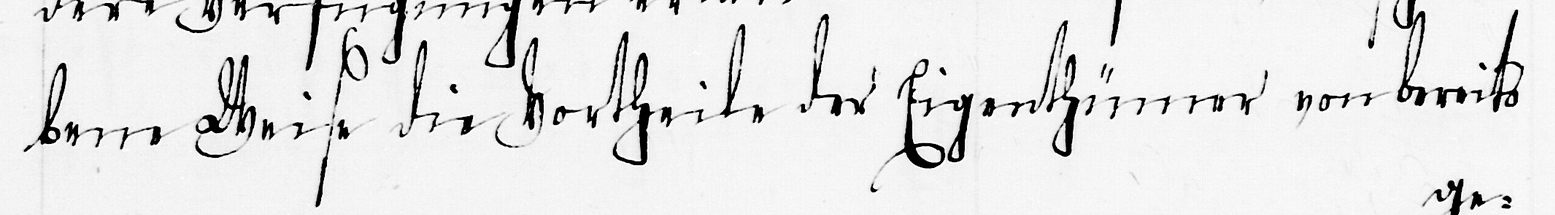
bene Weise die Vortheile der Eigenthümer von bereits
